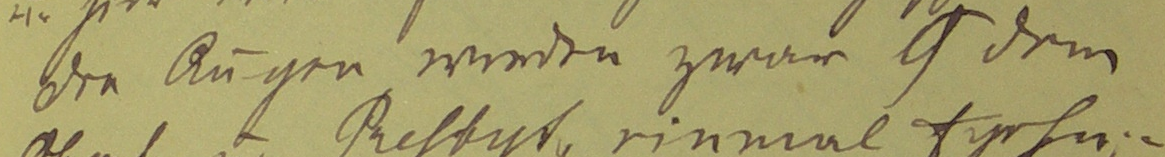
Die Augen werden werden zwar auch dem
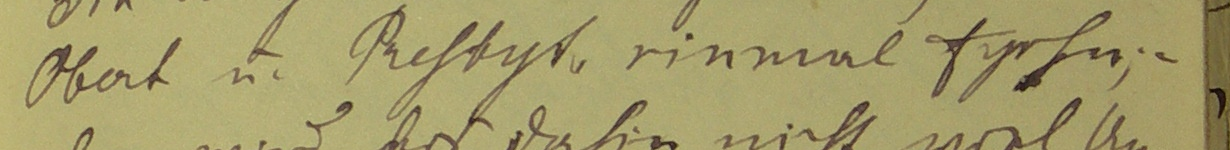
Obert und Presbyt. einmal fgehen; -
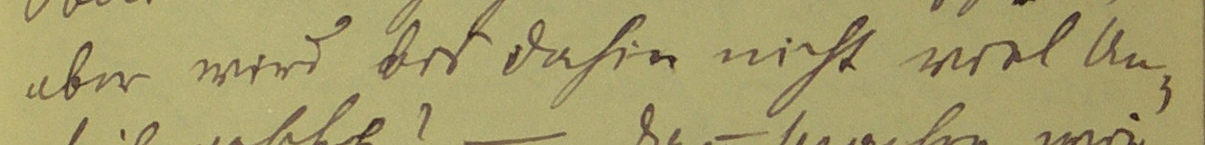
aber wird bis dahin nicht viel Un¬
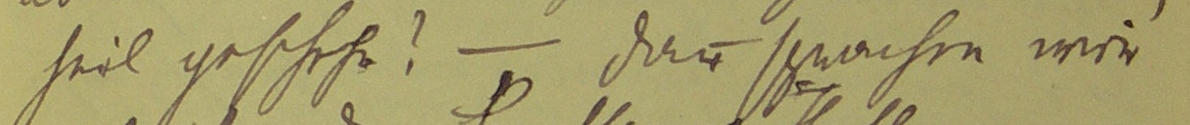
heil geschehen ? — Dann sprachen wir
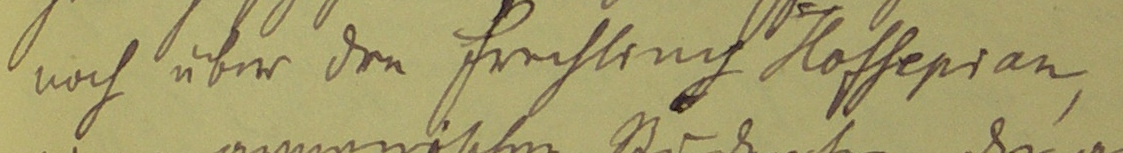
noch über den Frechling Hofsepian,
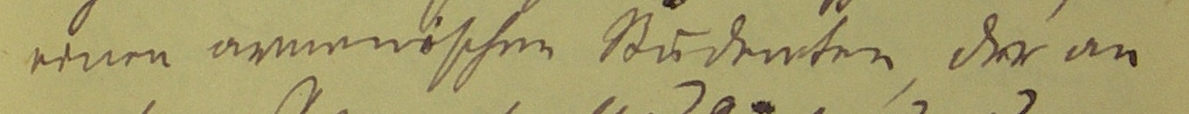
einen armenischen Studenten, der an
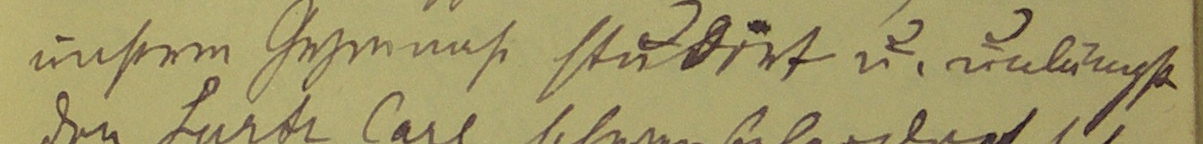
unserem Gymnasium studiert und unlängst
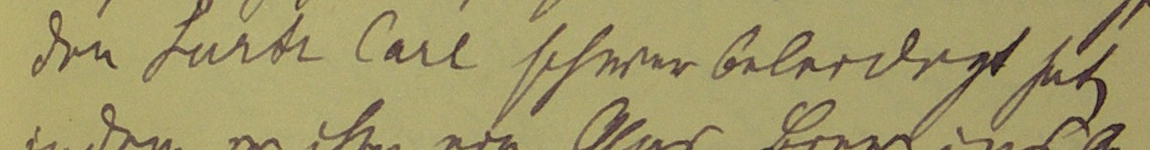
den Lurtz Carl schwer beleidigt hat,
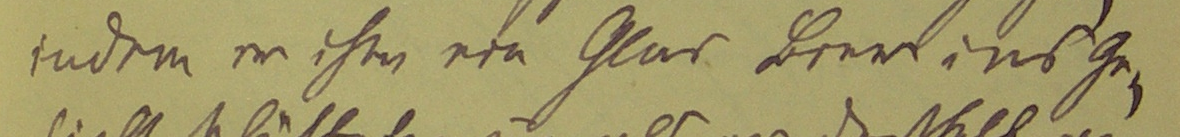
indem er ihm ein Glas Bier ins Ge¬
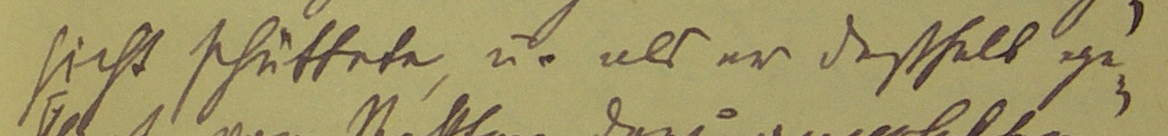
sicht schüttete, u. als er deshalb ge¬
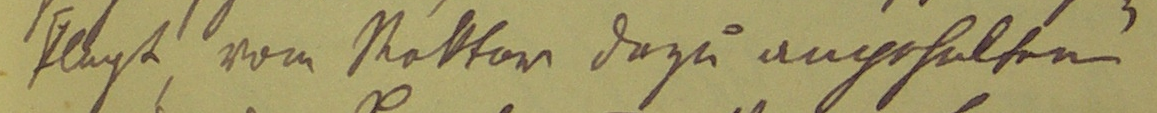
klagt, vom Rektor dazu angehalten
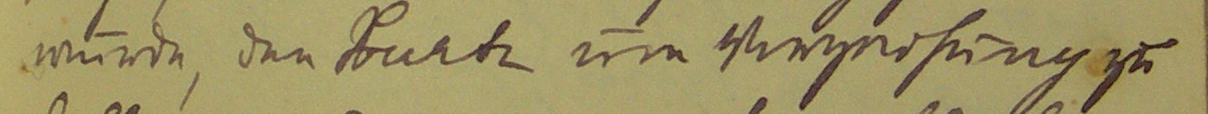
wurde, den Lurtz um Verzeihung zu
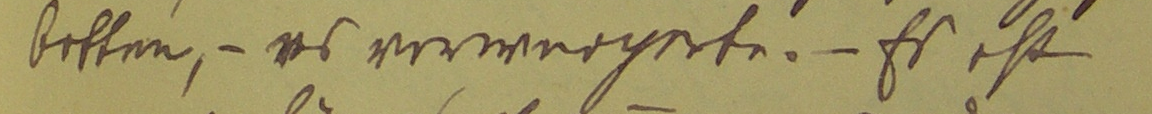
bitten, - es verweigerte. - Es ist
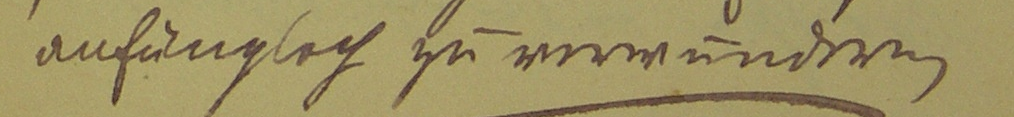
anfänglich zu verwundern
